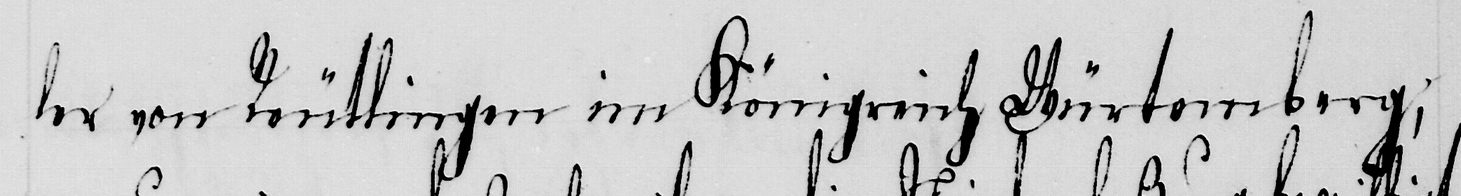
ler von Reutlingen im Königreich Würtemberg;
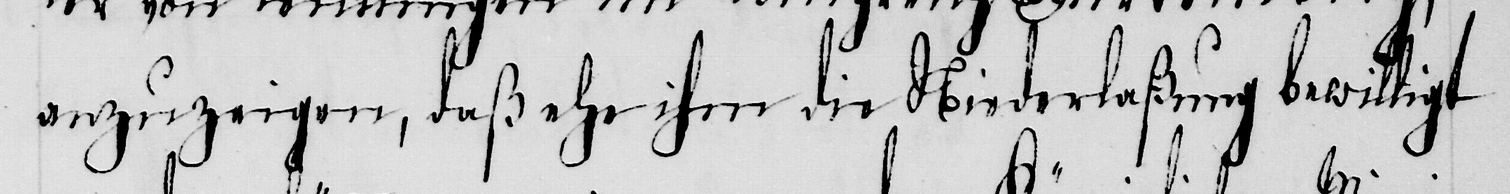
anzuzeigen, daß ehe ihm die Niederlaßung bewilligt
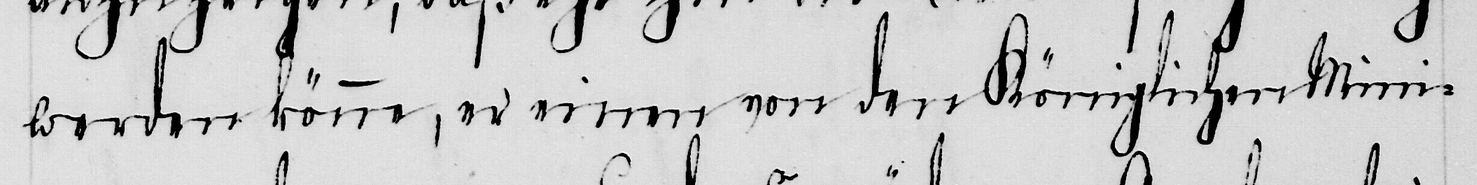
werden könne, er einen von den Königlichen Mini¬
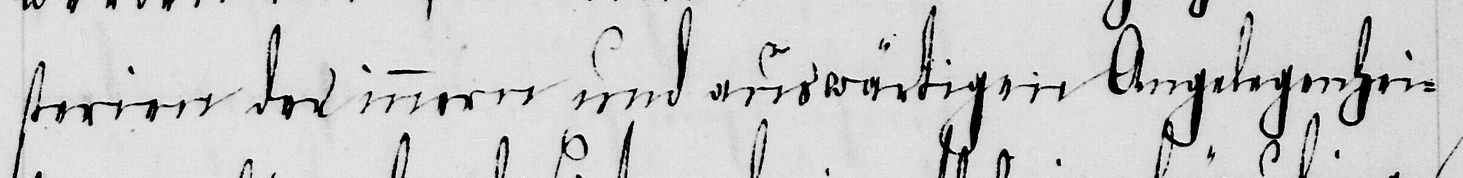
sterien der innern und auswärtigen Angelegenhei¬
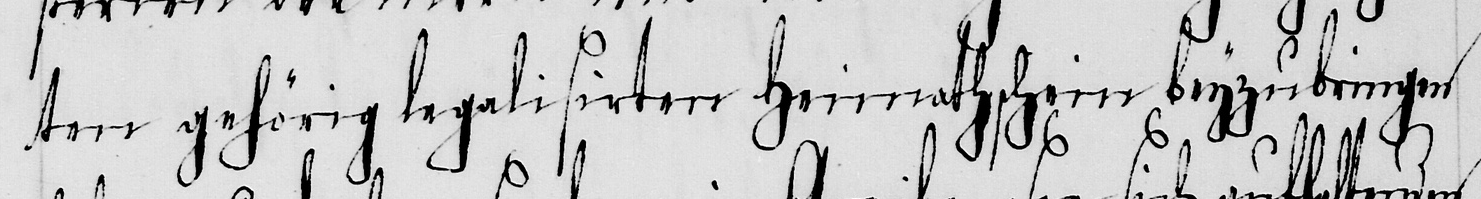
ten gehörig legalisirten Heimathschein beyzubringen
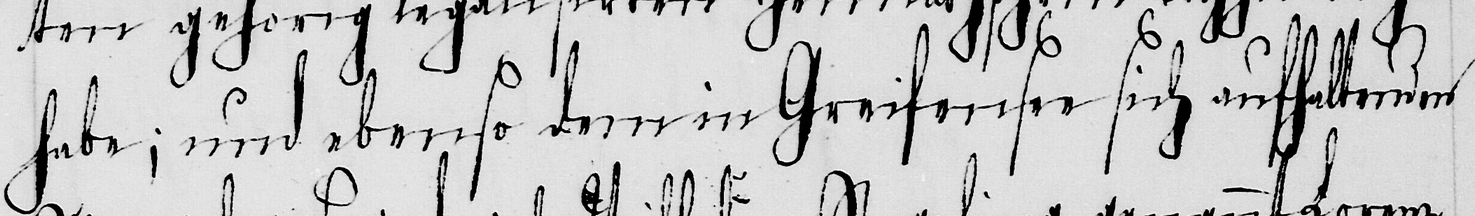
habe; und ebenso dem in Greifensee sich aufhaltenden
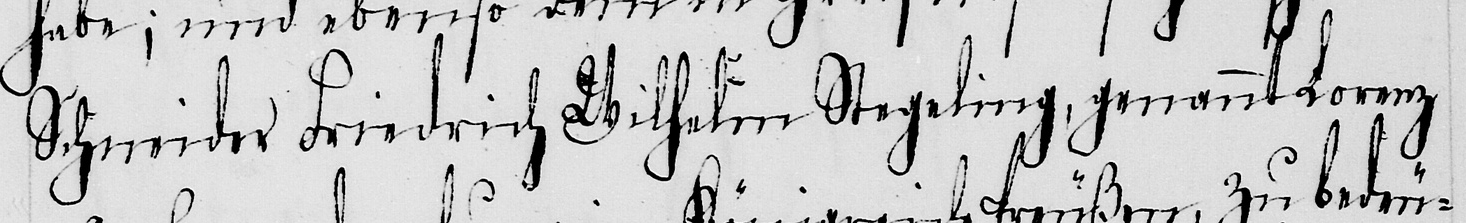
Schneider Friedrich Wilhelm Stegeling, genannt Lorenz
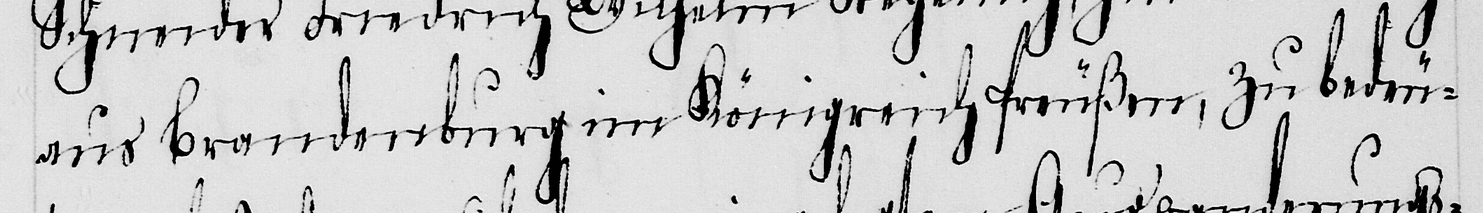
aus Brandenburg im Königreich Preußen, zu bedeu¬
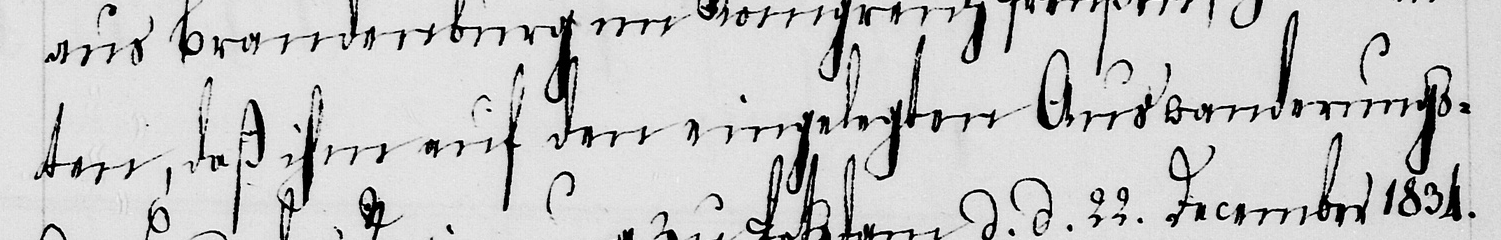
ten, daß ihm auf den eingelegten Auswanderung¬
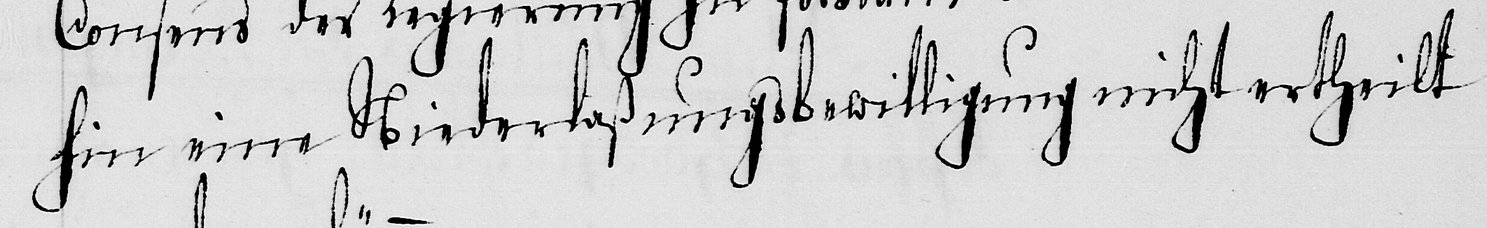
hin eine Niederlaßungsbewilligung nicht ertheilt
